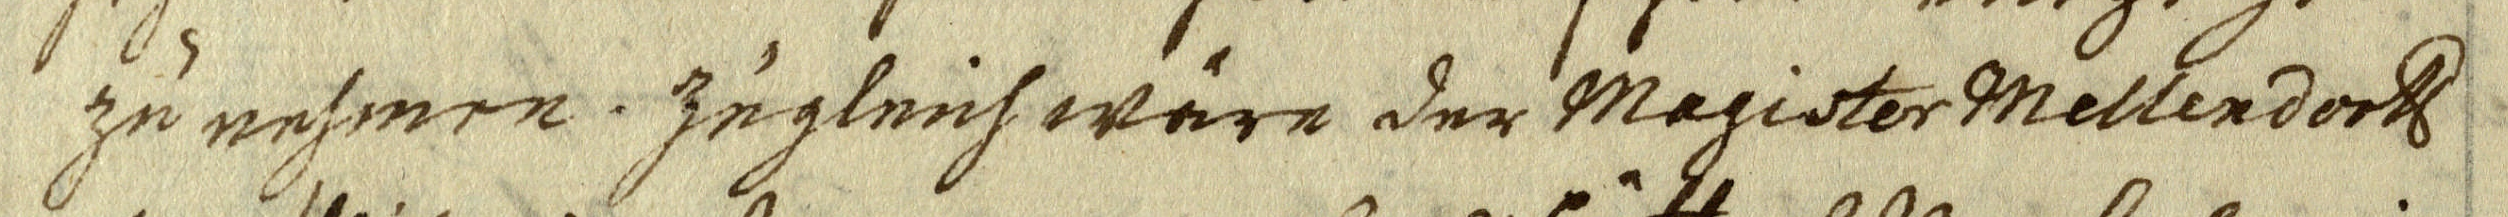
zu nehmen. Zugleich wäre der Magister Mellendorf
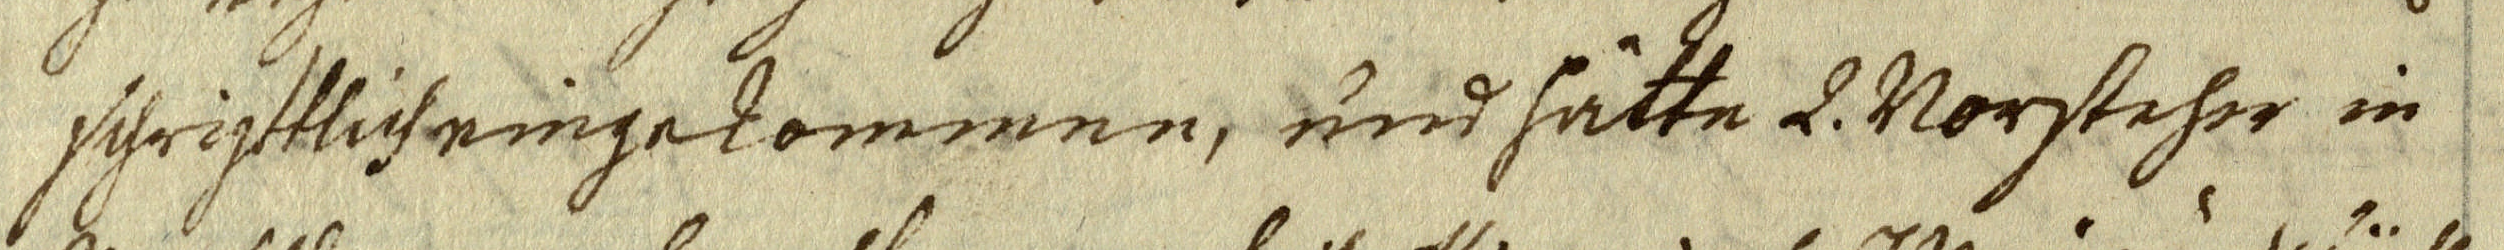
schriftlich eingekommen, und hätte 2. Vorsteher in
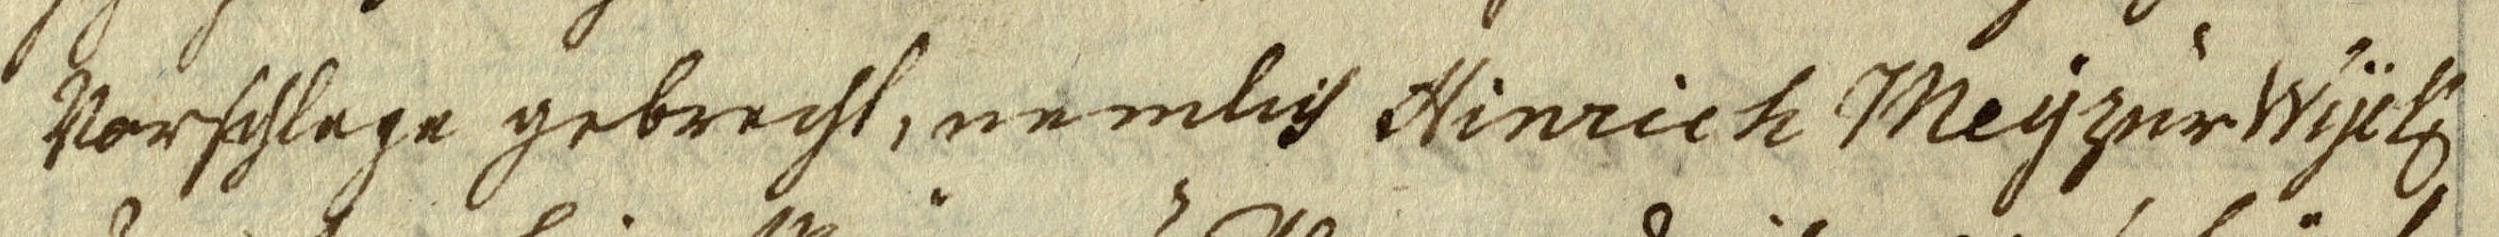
Vorschlage gebracht, nemlich Hinrich Meÿ zur Wÿck
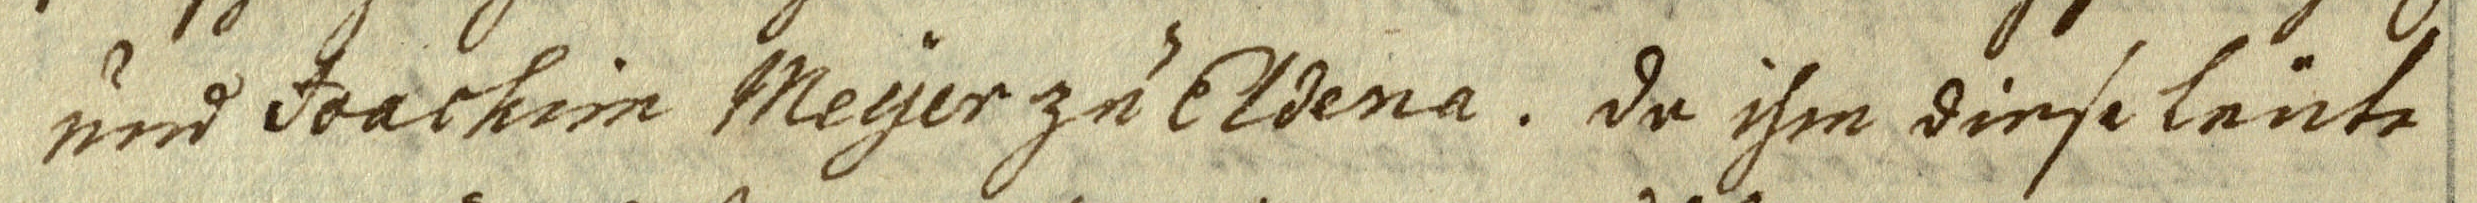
und Joachim Meÿer zu Eldena. da ihm diese Leute
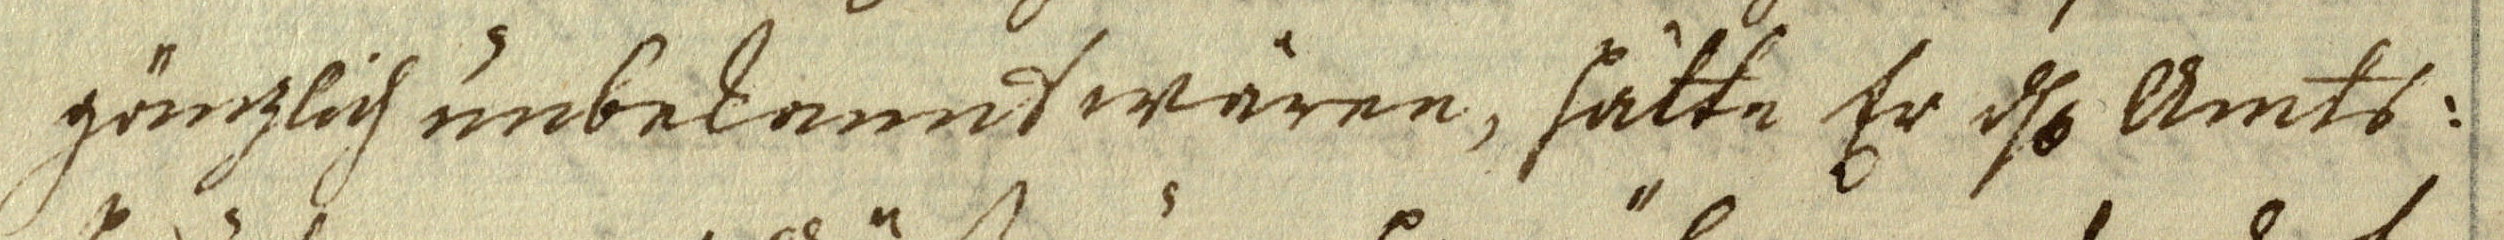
gänzlich unbekannt wären, hätte Er dh Amts¬
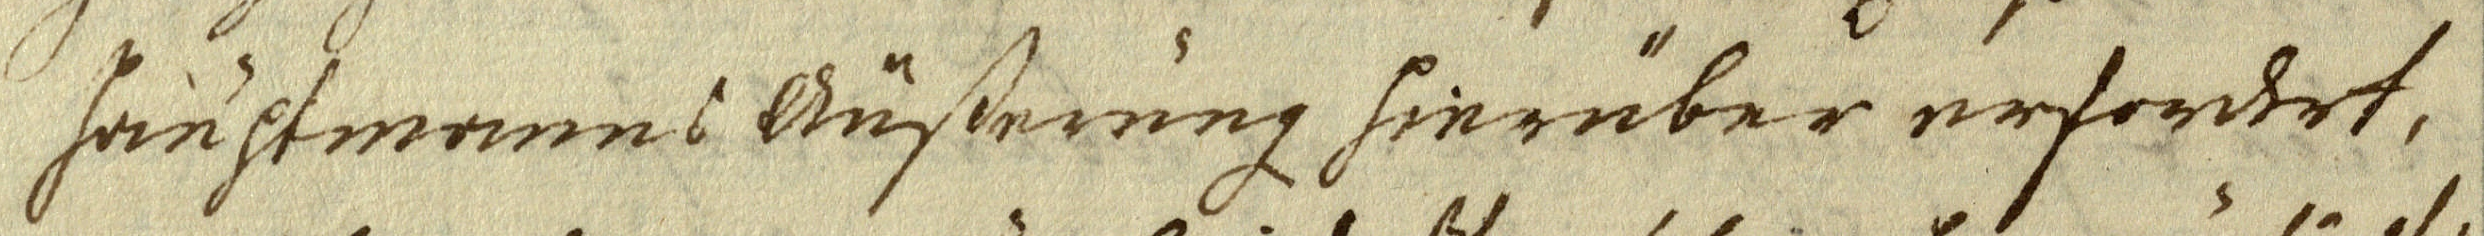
hauptmanns Äußerung hierüber erfordert,
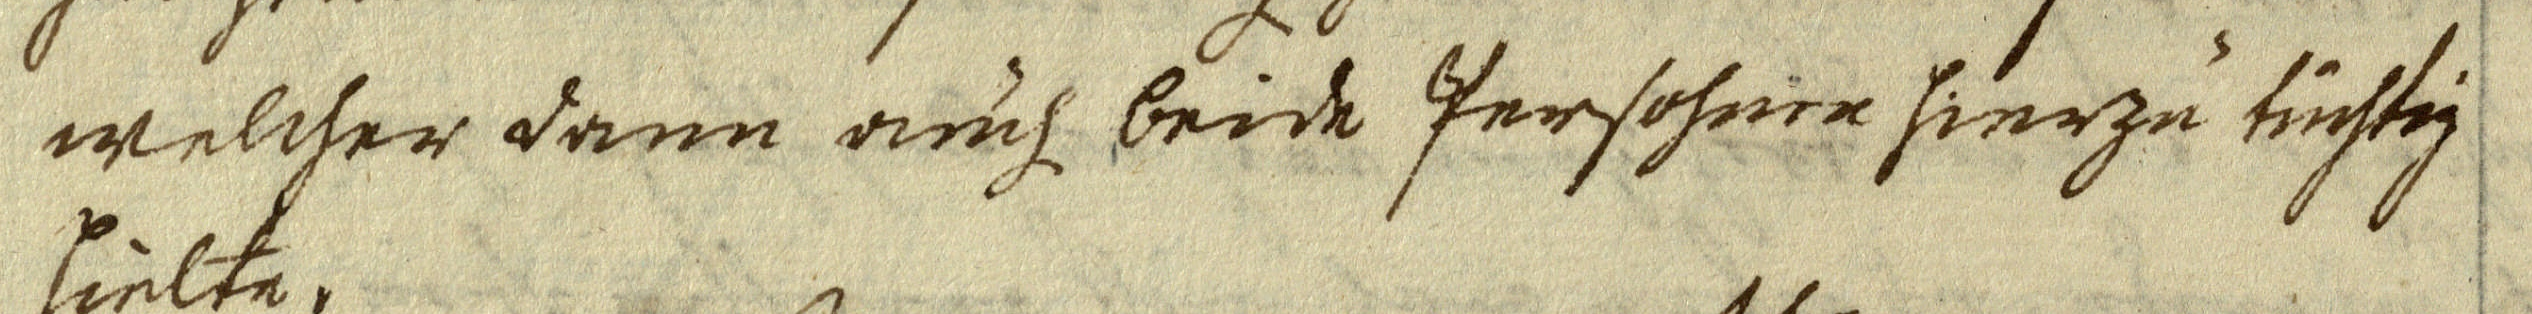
welcher dann auch beide Persohnen hierzu tüchtig
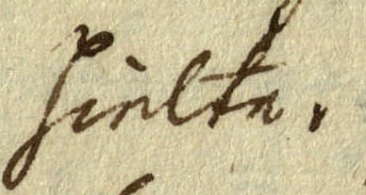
hielte.
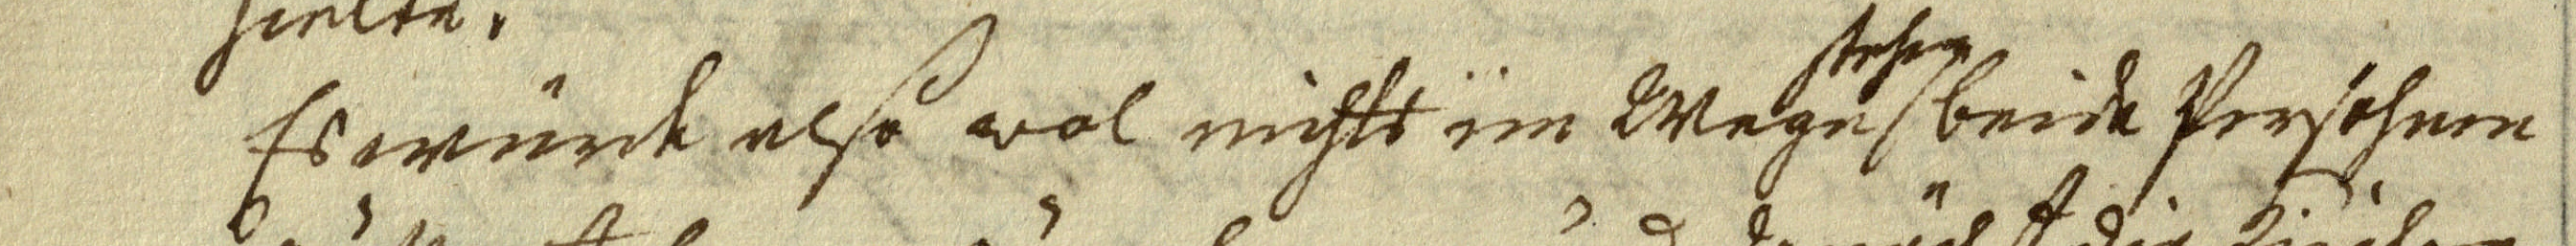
Es würde also wol nichts im Wege stehen, beide Persohnen
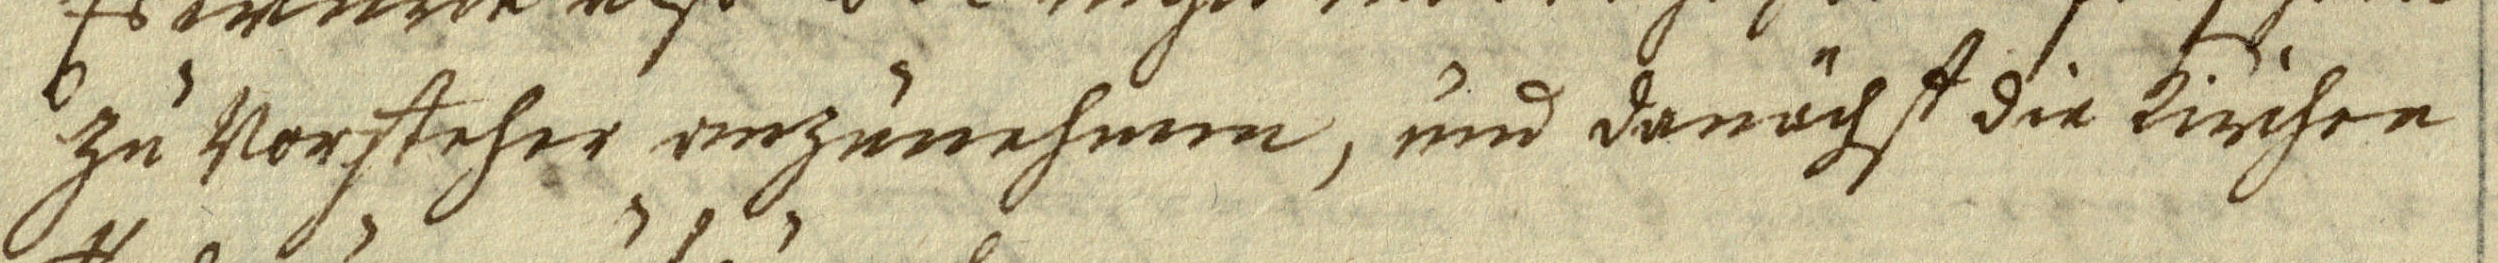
zu Vorsteher anzunehmen, und danächst die Kirchen
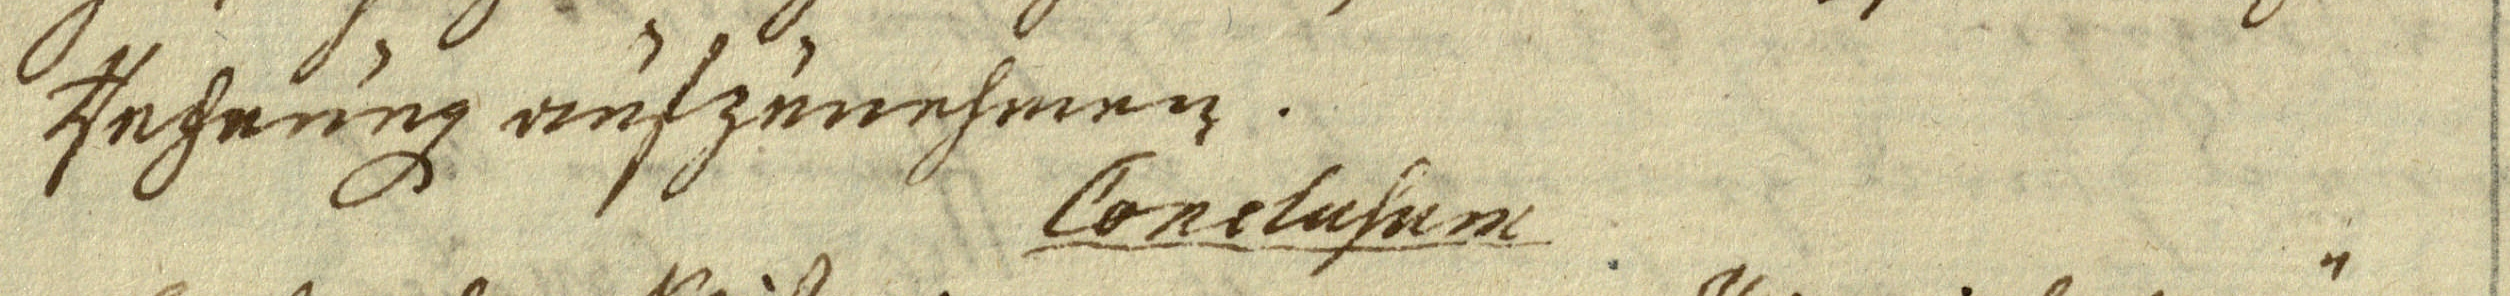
Rechnung aufzunehmen.
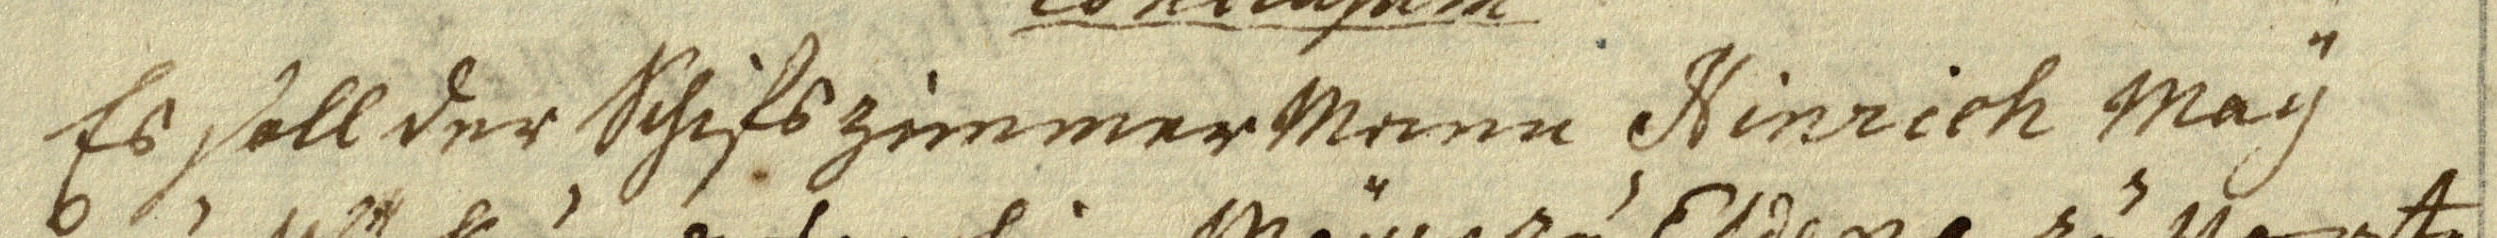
Es soll derSchifszimmer Mann Hinrich Maÿ
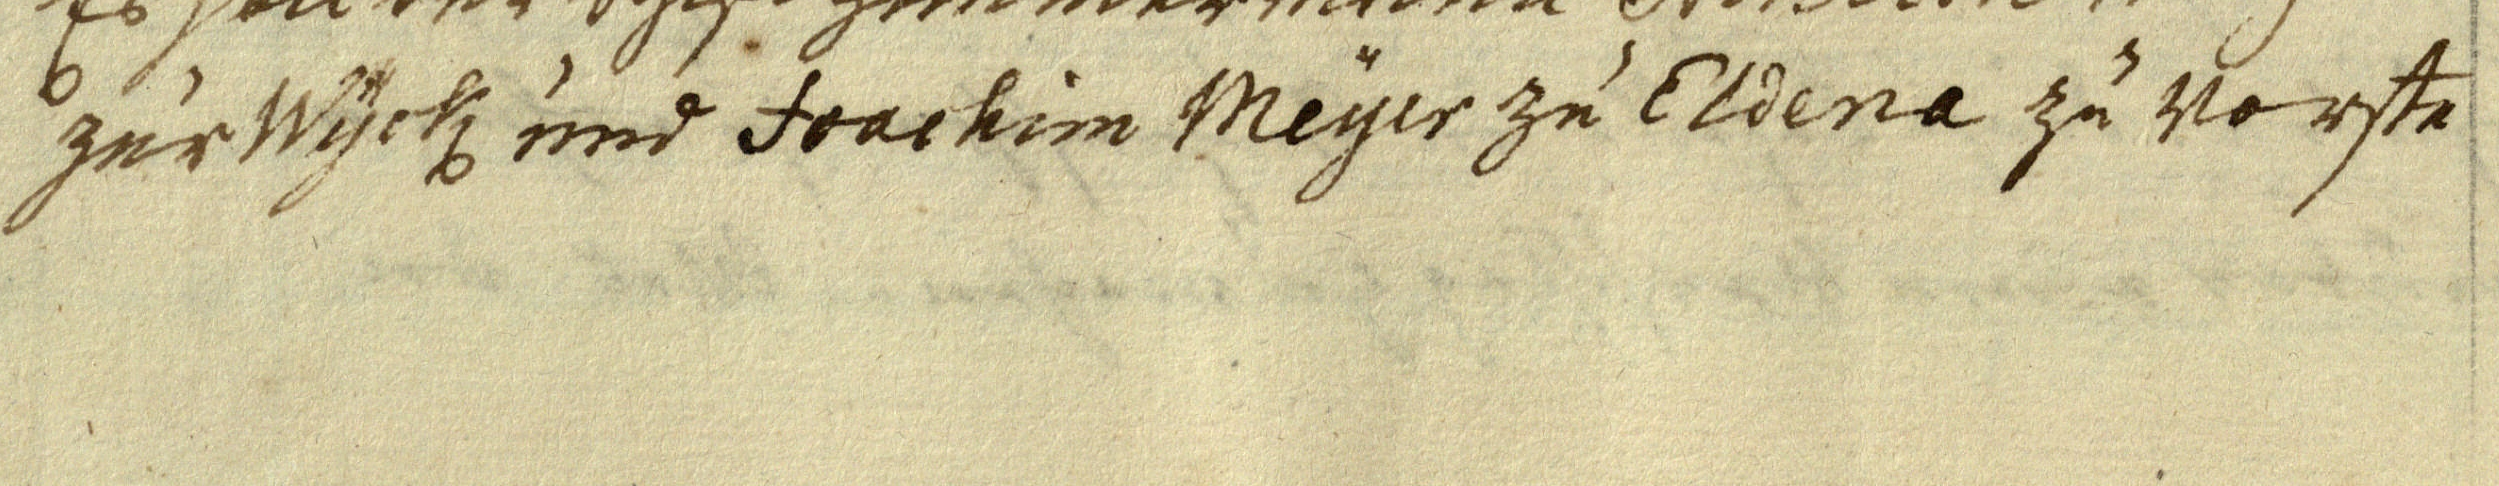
zur Wÿck und Joachim Meÿer zu Eldena zu Vorste
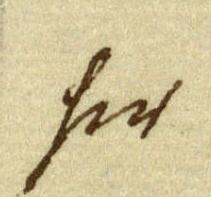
her
